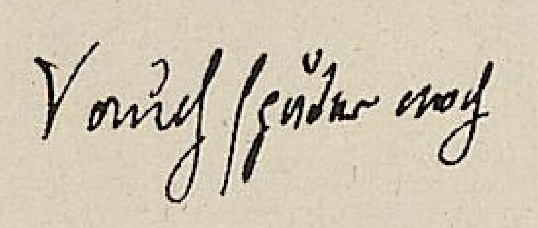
V auch später noch
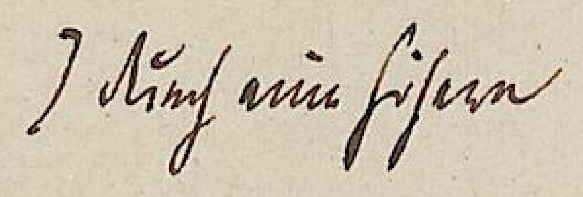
] durch eine höhere
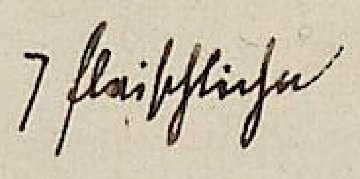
] fleischliche
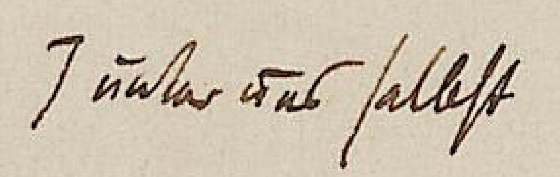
] unter uns selbst
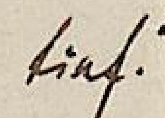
tief.
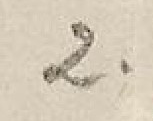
2.
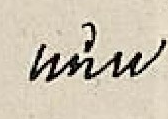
nun
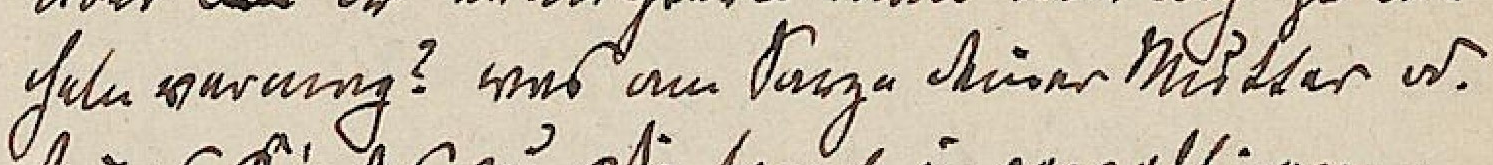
chele vermag? was am Sarge deiner Mutter od.
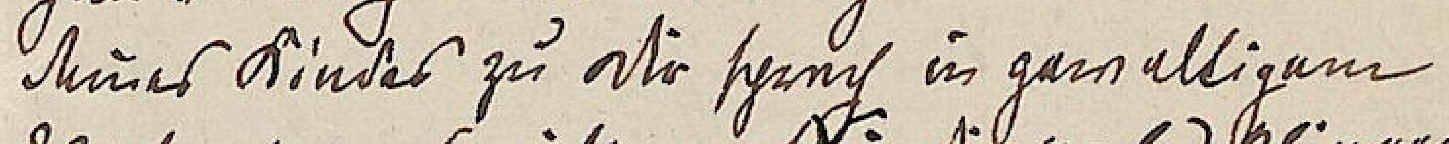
deines Kindes zu Dir sprach in gewaltigem
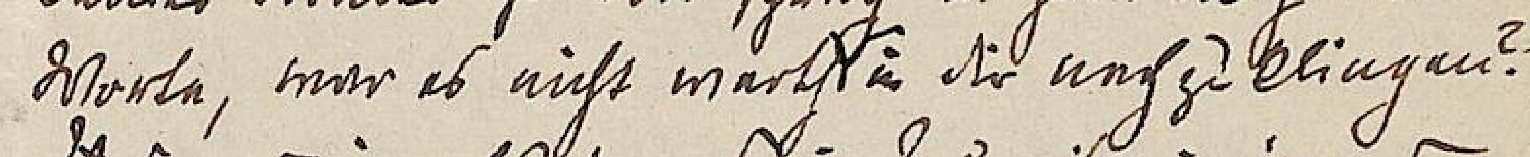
Worte, war es nicht werth in dir nach zu klingen?
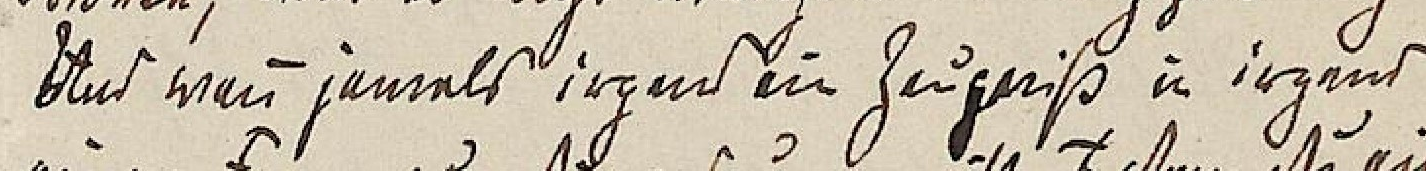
Und wen jemals irgend ein Zeugniß in irgend
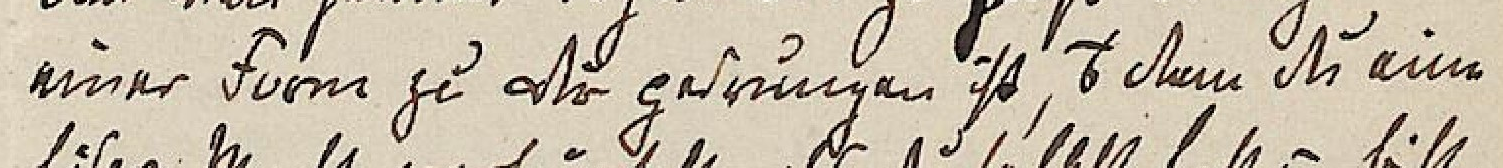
einer Form zu Die gedrungen ist, s dem du eine
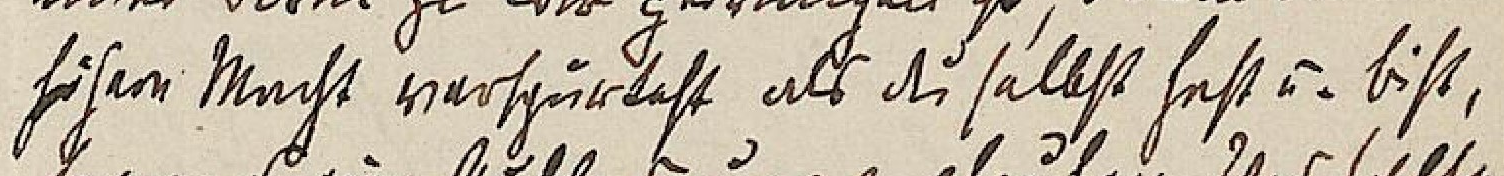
höhere Macht verspürtest als du selbst hast u. bist,
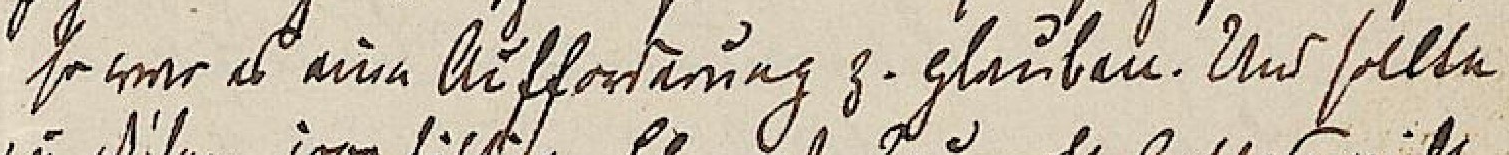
so war es eine Aufforderung z. glauben. Und sollte
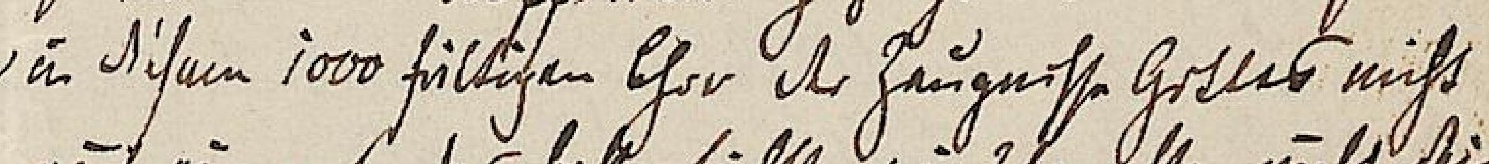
in diesem 1000 fälltigen Chor der Zeugnisse Gottes nicht
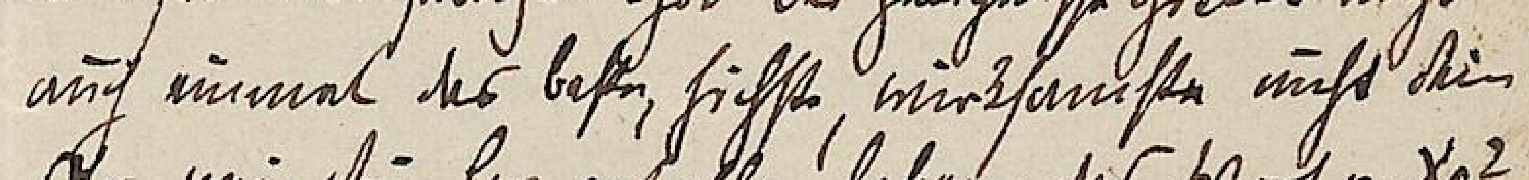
auch einmal das beste, frischste, wirksamste nicht dein
